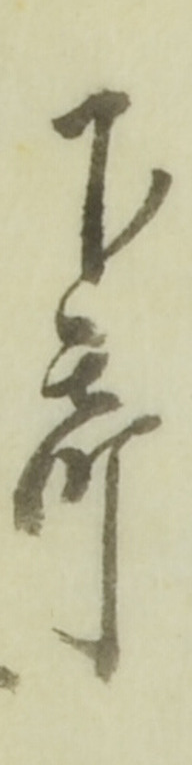下モ町
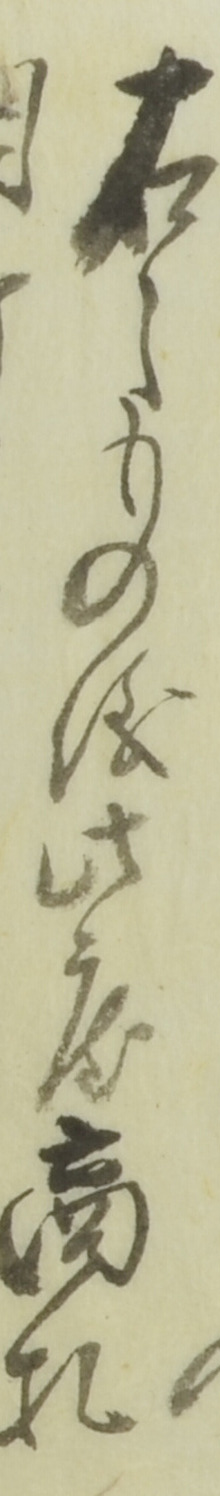右之もの儀此度商札
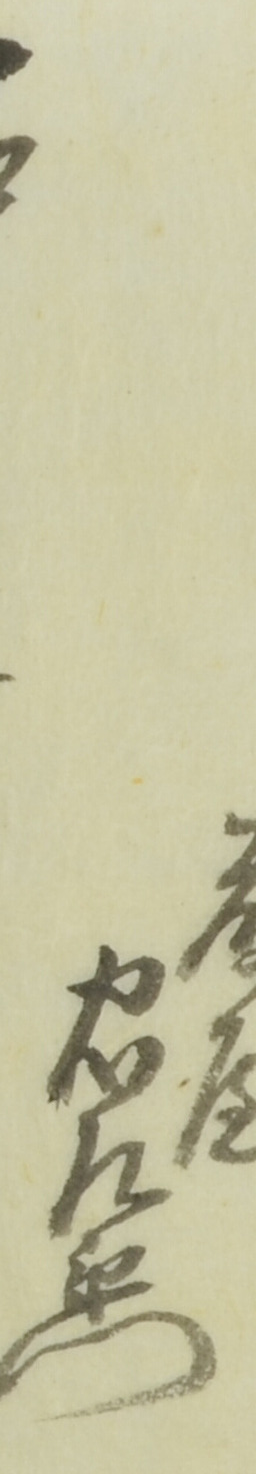忠左衛門
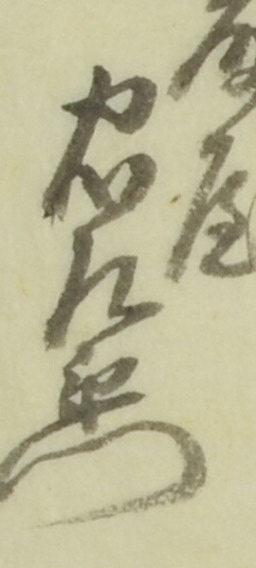忠左衛門
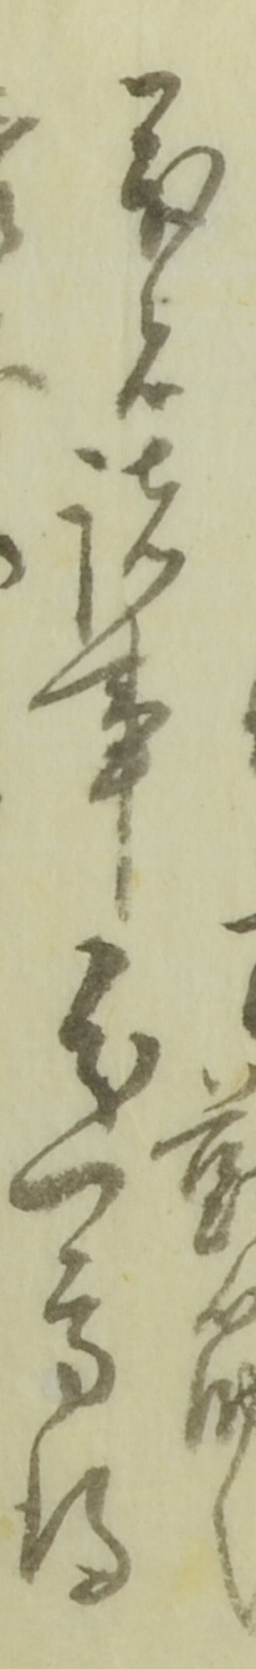義者諸事分一方得
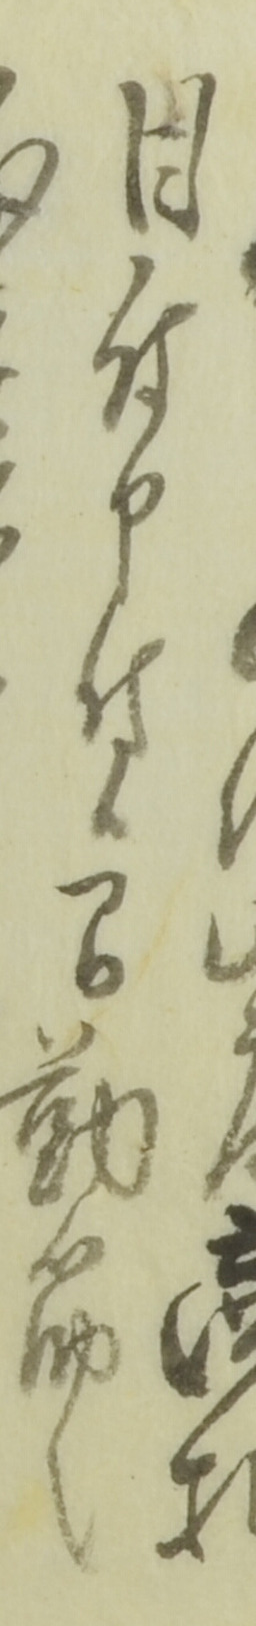目付申付候間勤筋之
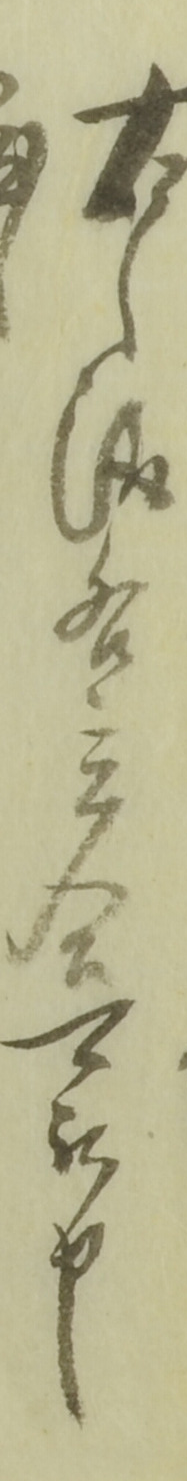右之儀各立合可被申
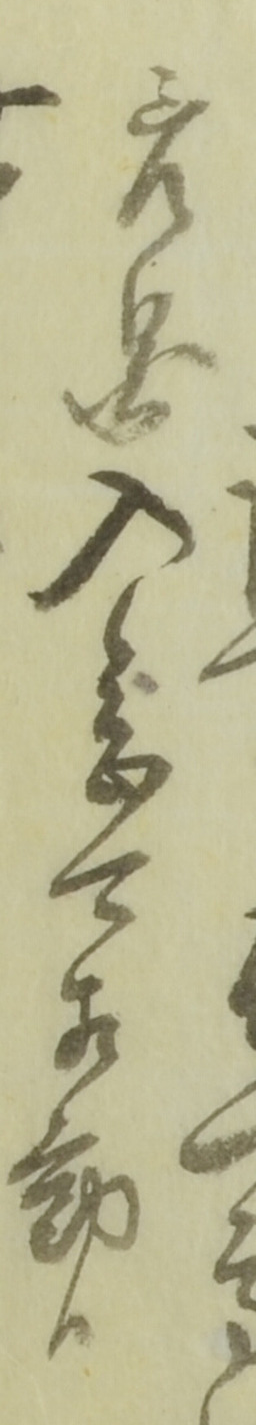差図入念可相勤候
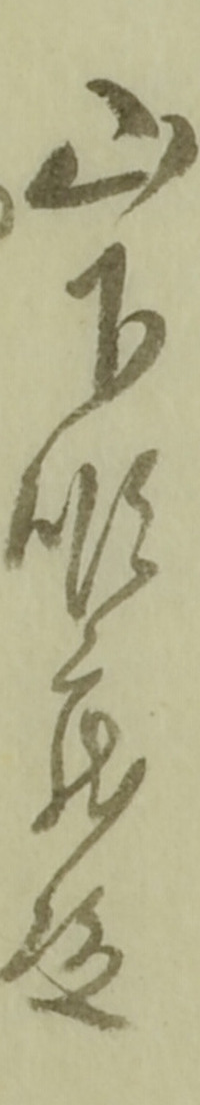山下順蔵殿

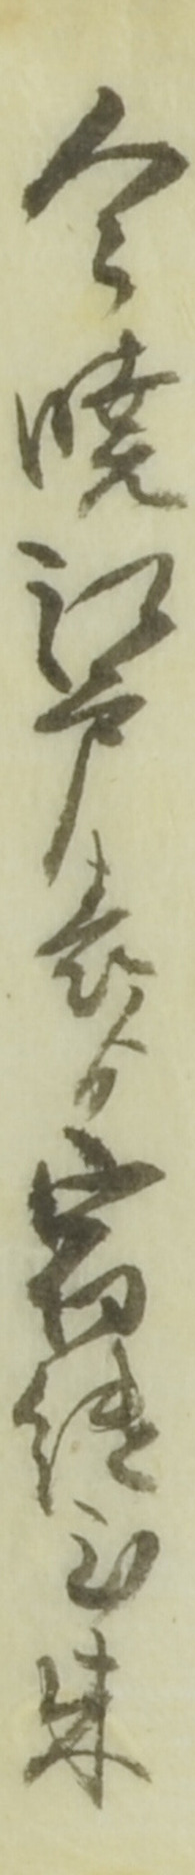今暁江戸表ゟ宿継出来
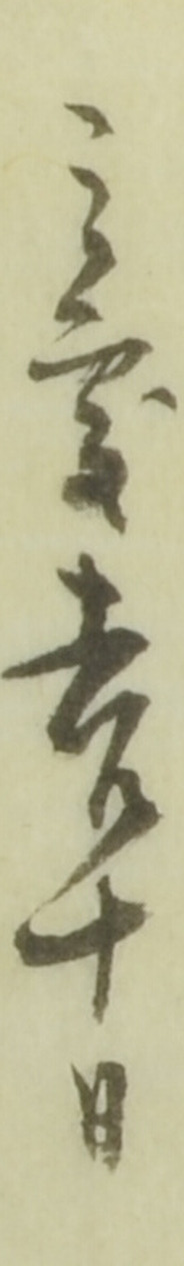之処去ル十日
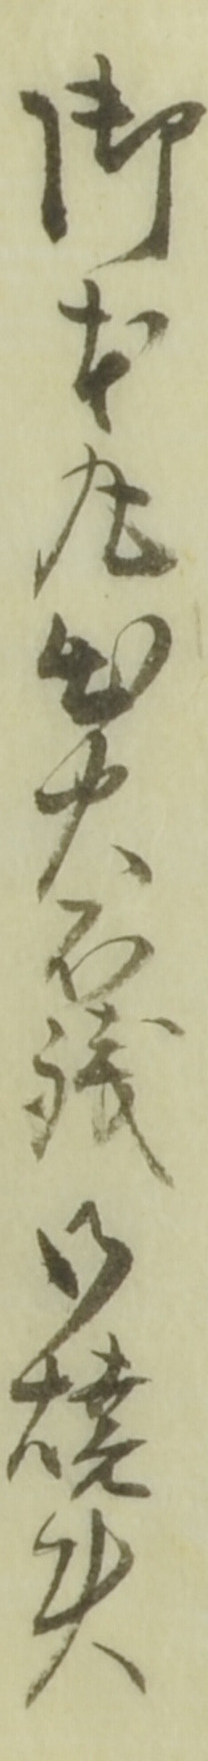御本丸出火不残御焼失
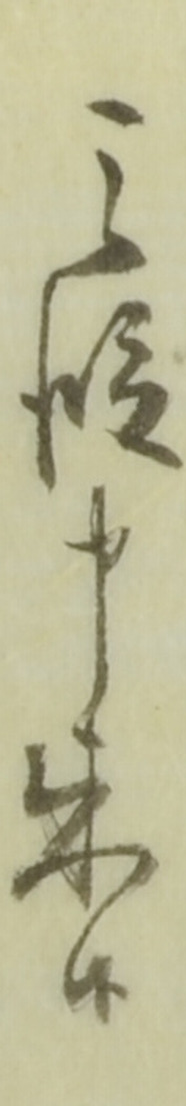之段申来候
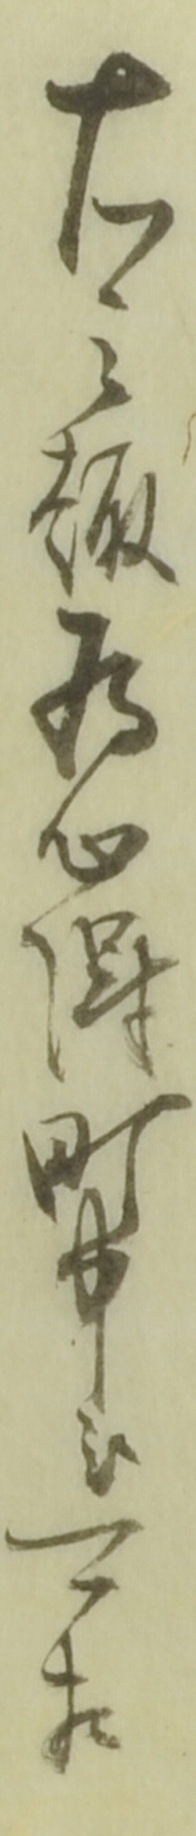右之趣為心得町中江可相
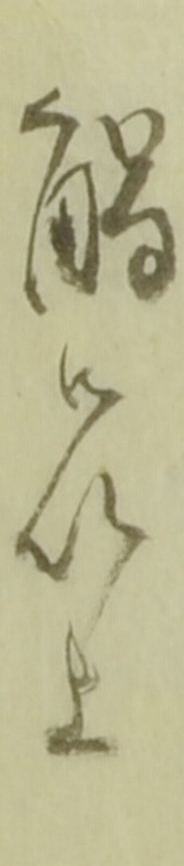触候以上
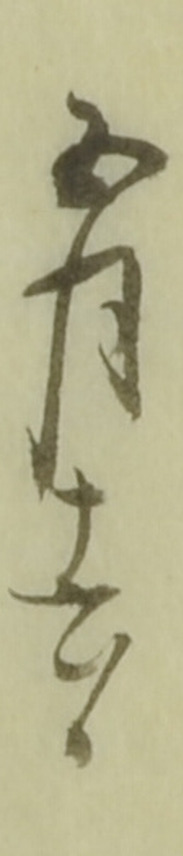五月十六日
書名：御触書御書附控
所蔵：伊那市立高遠町図書館・合同会社AMANE
